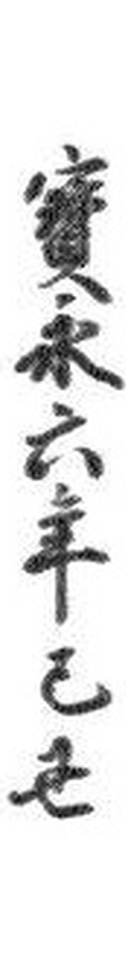宝永六年已丑
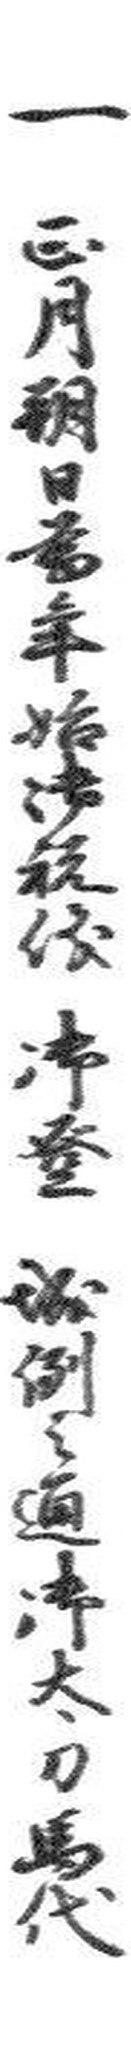一正月朔日為年始御祝儀御登城例之通御太刀馬代
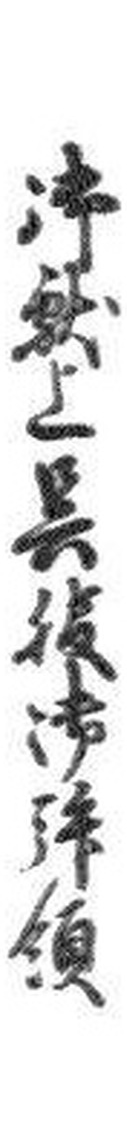御献上呉服御拝領
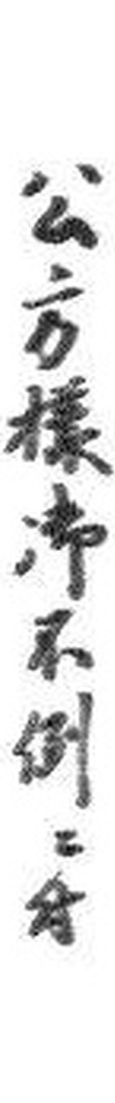公方様御不例ニ付
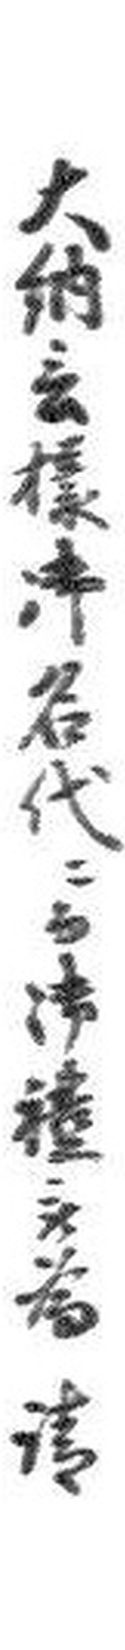大納言様御名代ニ而御礼被為請

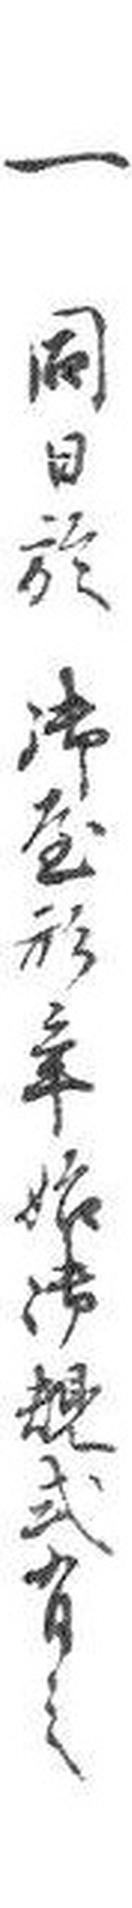一同日於御屋形年始御規式有之
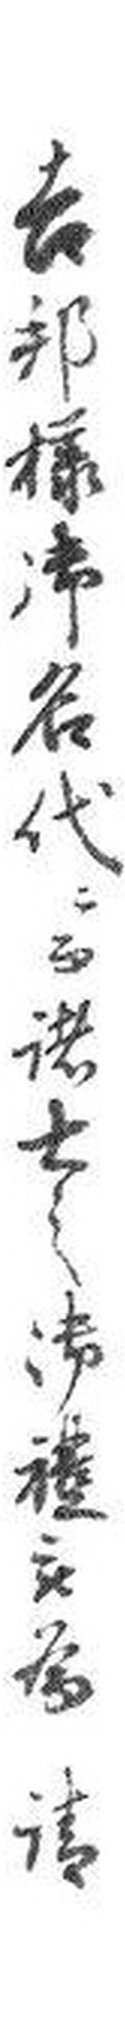吉邦様御名代ニ而諸士之御礼被為請
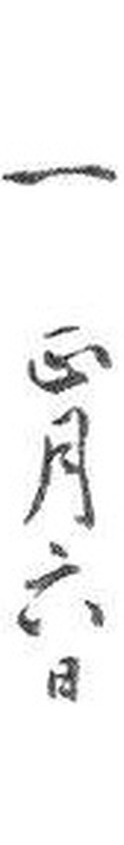一正月六日
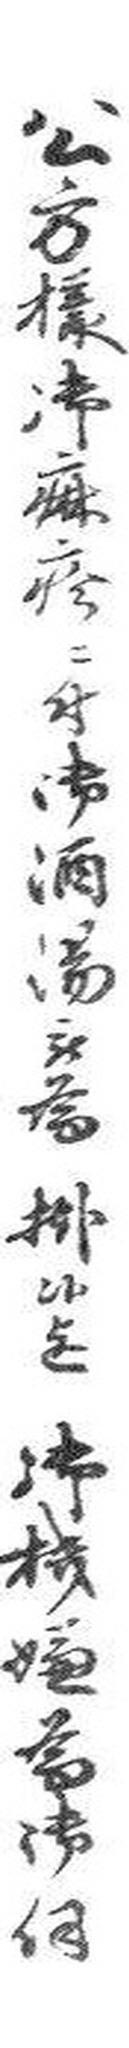公方様御麻疹ニ付御酒湯被為掛候を御機嫌為御伺
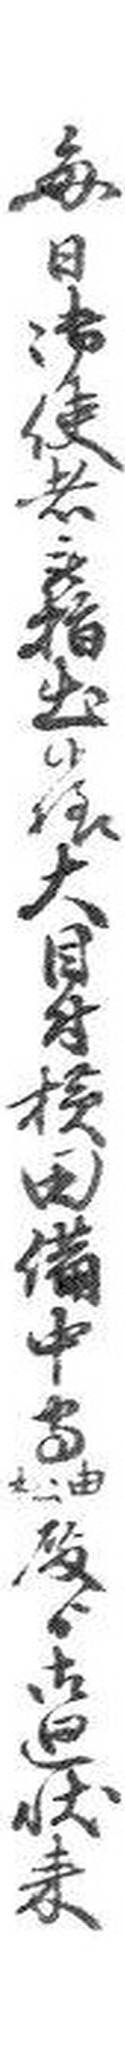毎日御使者被指出候様大目付横田備中守由松殿ゟ御廻状来
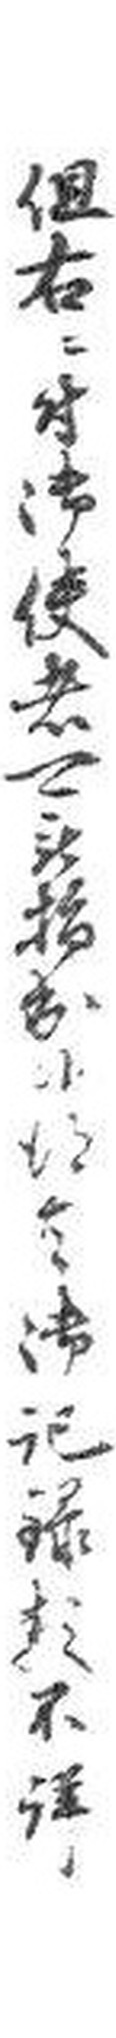但右ニ付御使者可被指出候得共御記録類不詳
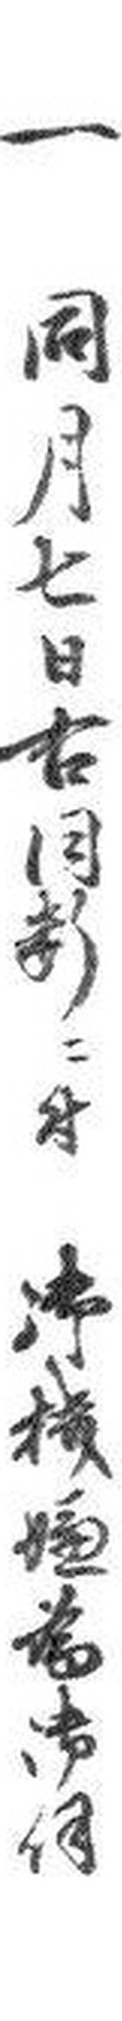一同月七日右同断ニ付御機嫌為御伺
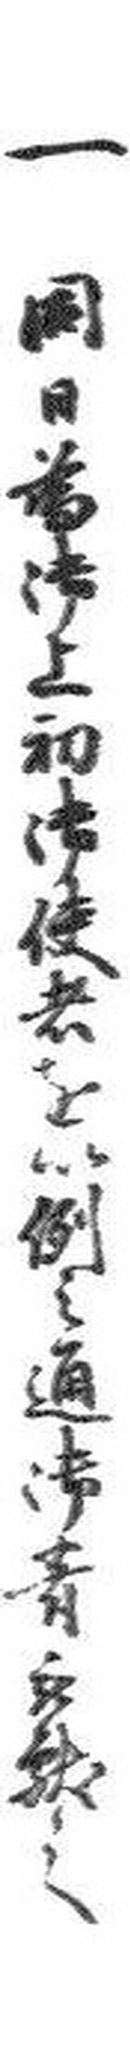一同日為御上初御使者を以例之通御肴被献之
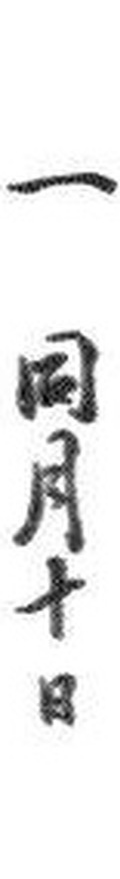一同月十日
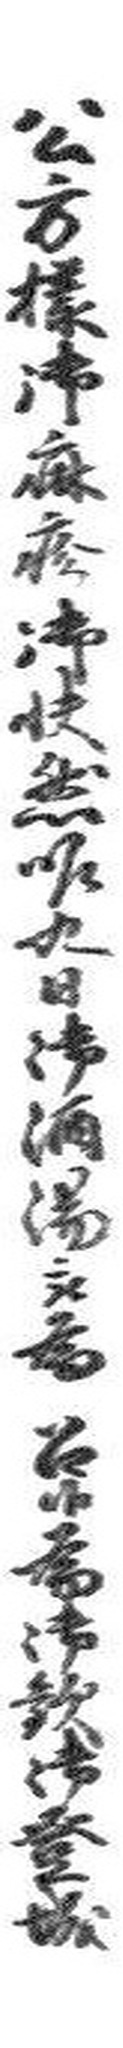公方様御麻疹御快然昨九日御酒湯被為召候為御歓御登城
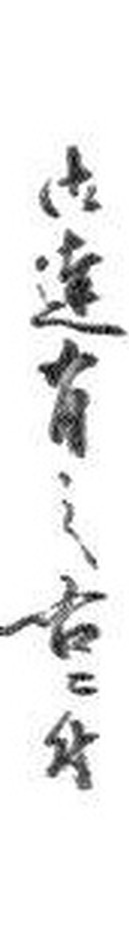御達有之右ニ付
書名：家譜 二十五 吉品公 従宝永六年到同七年
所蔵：福井県文書館 Fukui Prefectural Archives
